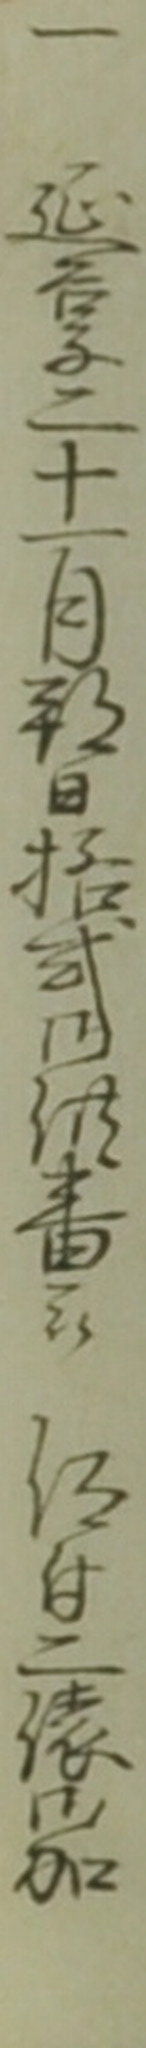一延享二十一月朔日格式御供番被仰付二俵御加

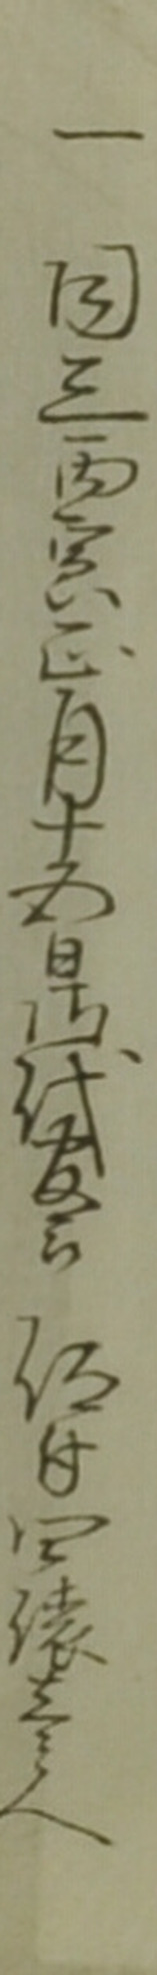一同三丙寅正月十五日御代官被仰付四俵壱人
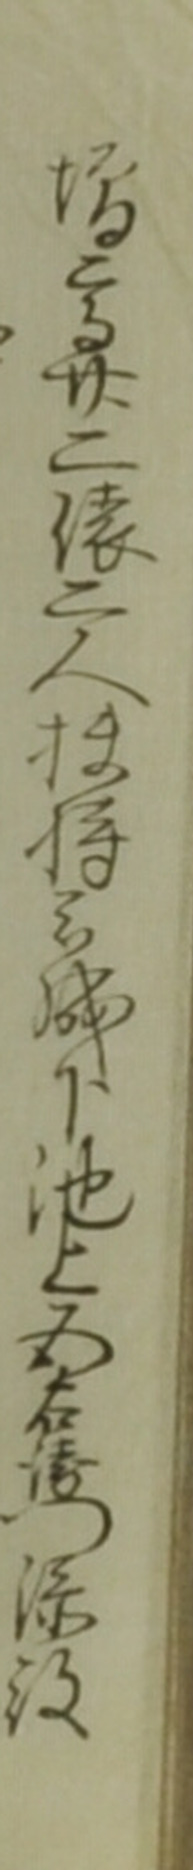増高廿二俵二人扶持被成下池上五右衛門添役
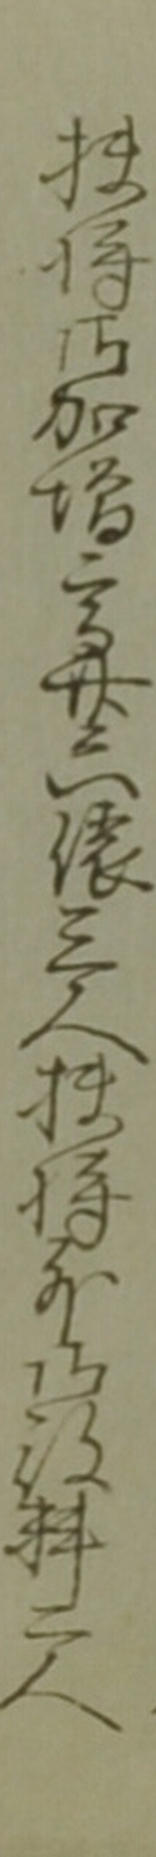扶持御加増高廿六俵三人扶持外御役料二人
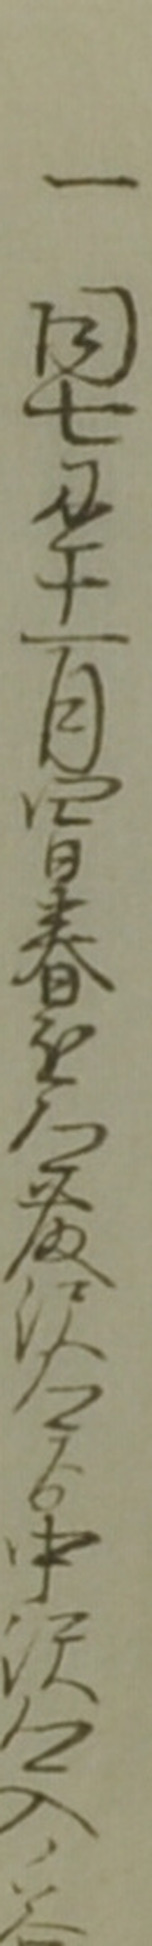一同七丑十一月四日春近郷藤沢郷ゟ中沢郷入谷
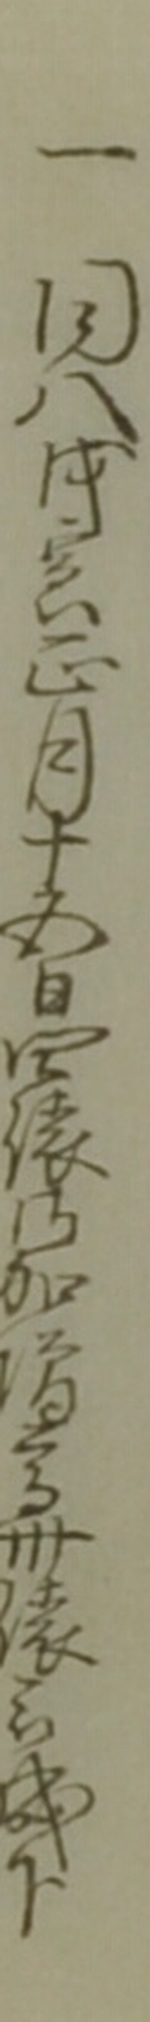一同八戊寅正月十五日四俵御加増高卅被成下
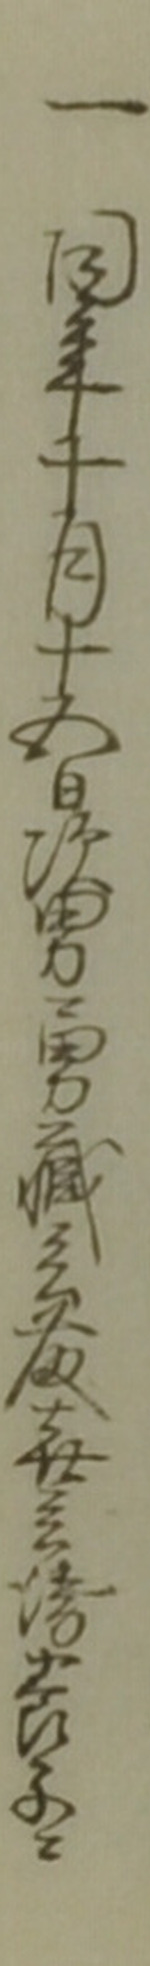一同年十月十五日次男勇蔵兵藤喜兵衛養子
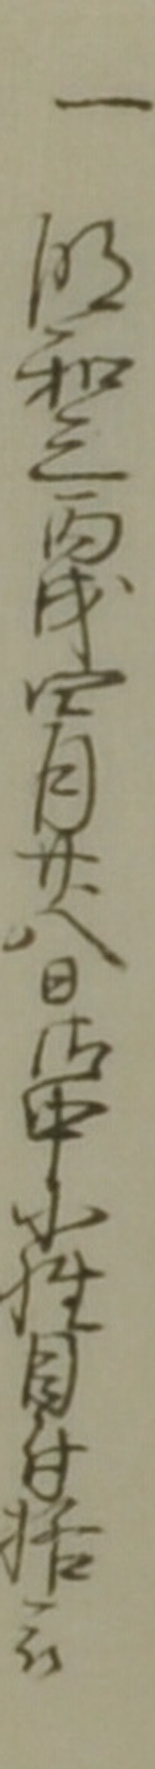一明和三丙戌四月廿八日御中小性目付格被
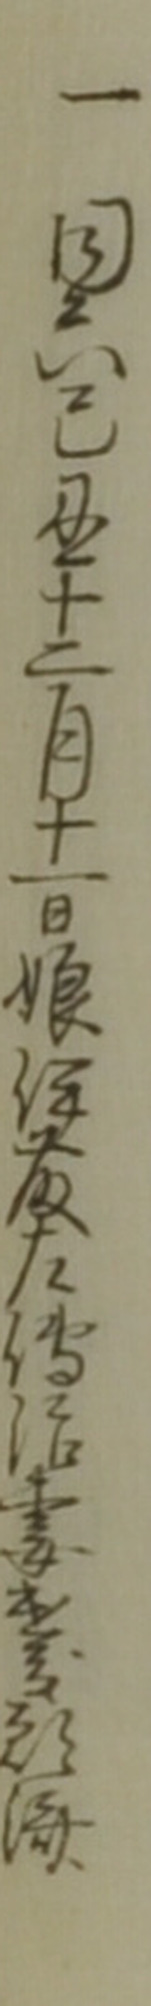一同六己丑十二月十一日娘伊藤左伝次妻遣度願済
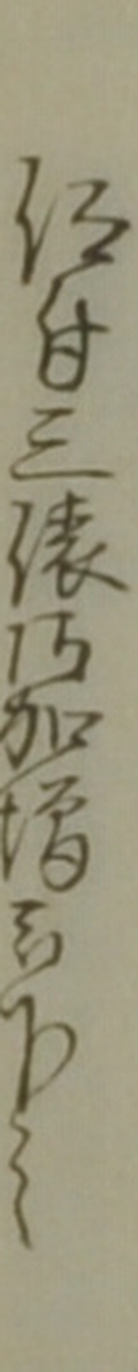仰付三俵御加増被下之
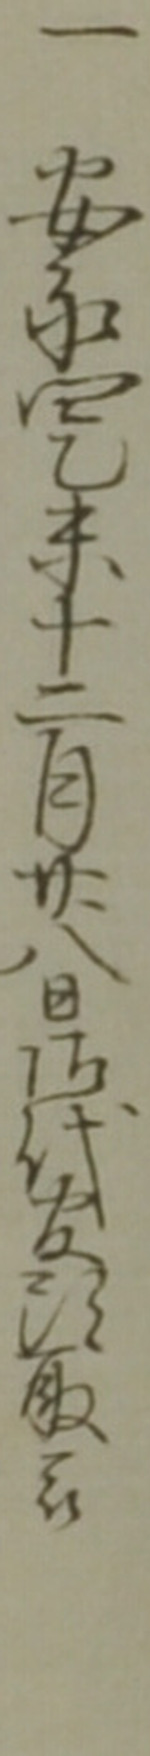一安永四乙未十二月廿八日御代官頭取被
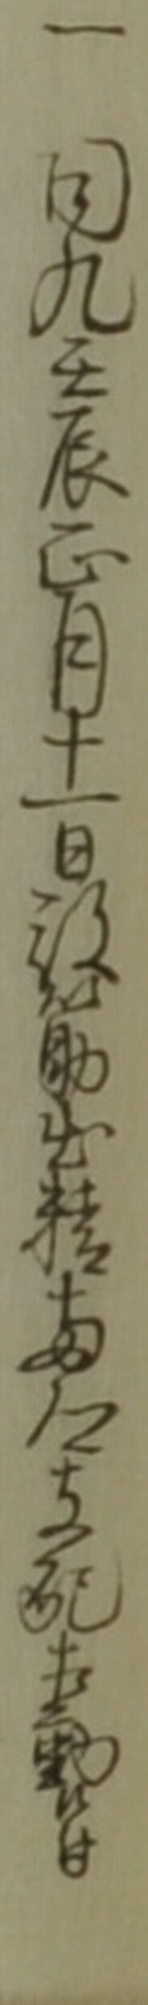一同九壬辰正月十一日役筋出精両郷支配相勤候付
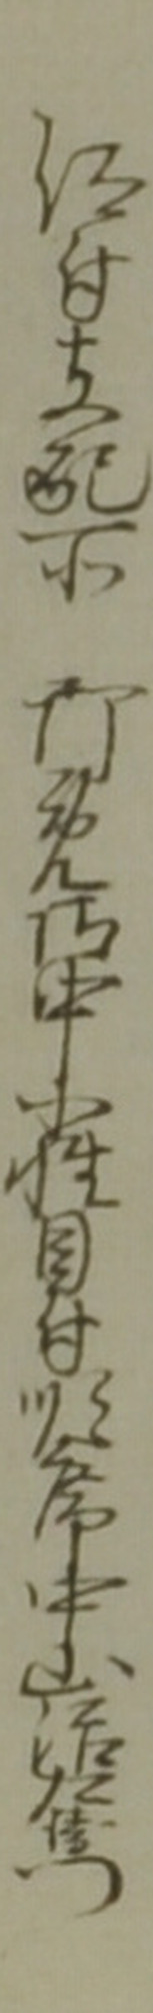仰付支配所御免御中小性目付順席中山治左衛門
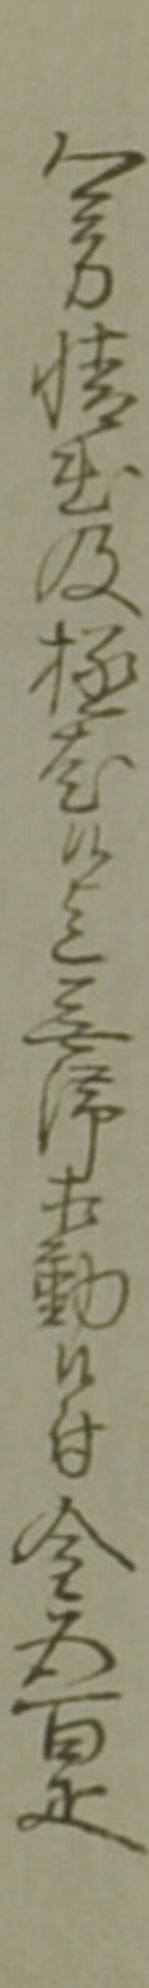郷方情出及極老候迄無滞相勤候付金五百疋
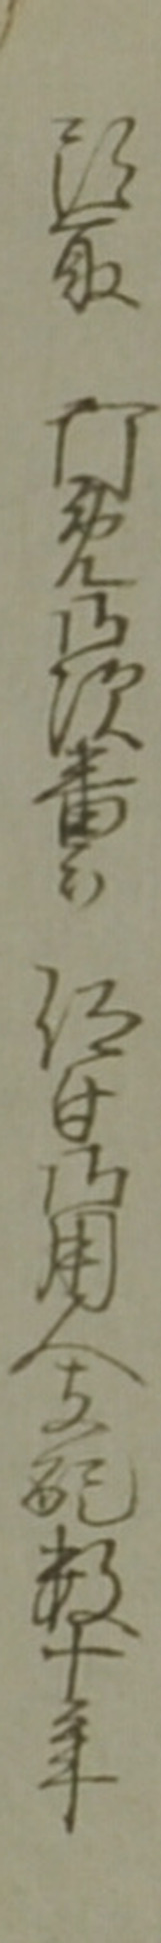頭取御免御次番被仰付御用人支配数十年
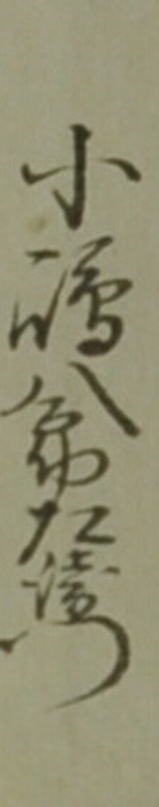小嶋八郎左衛門
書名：無足廃家（弐）
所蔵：伊那市立高遠町図書館・合同会社AMANE
